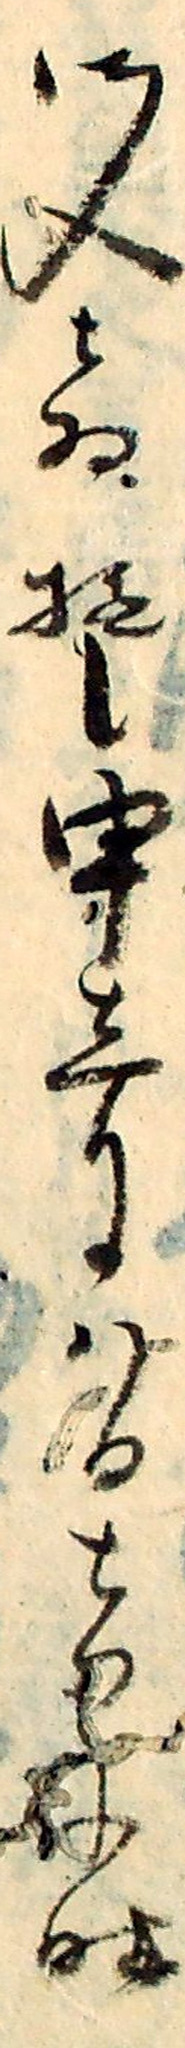御入被為遊候申十二月八日七つ半時
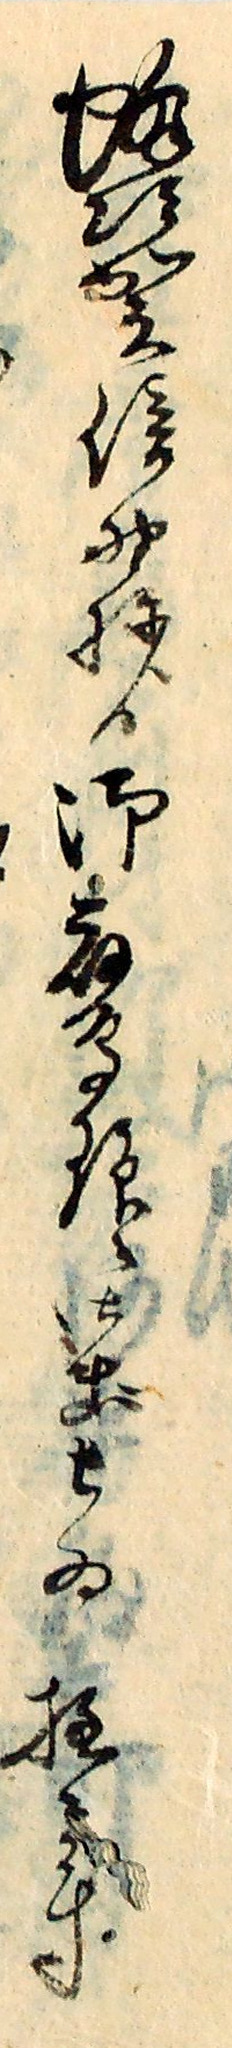蜂須賀信濃様ゟ御鷹野え御出被為遊ニ付
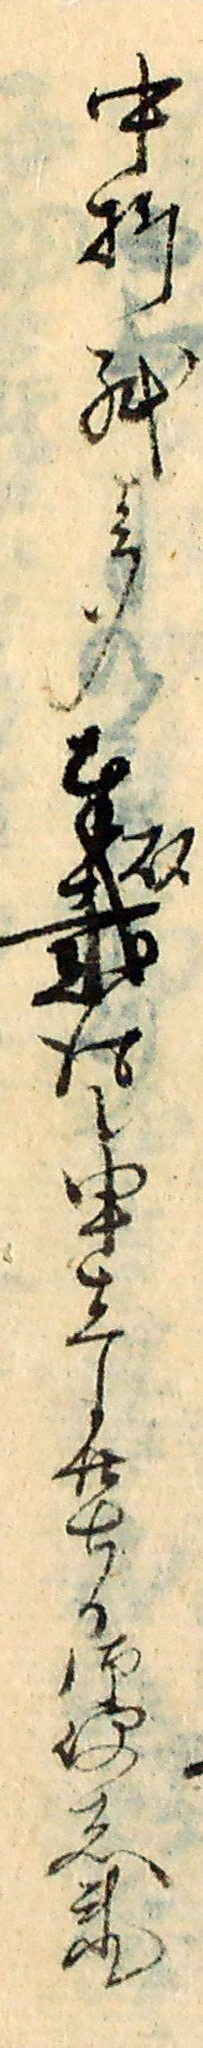中折紙壱〆奉頂戴仕候申十二月廿七日御使者来
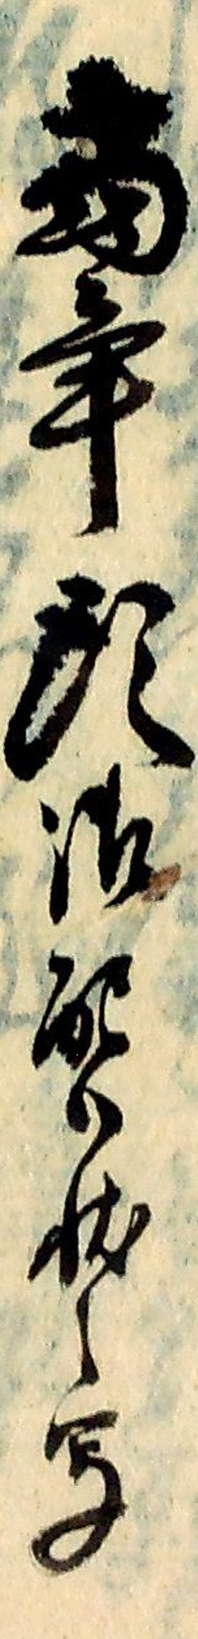当年頭御配り状之写
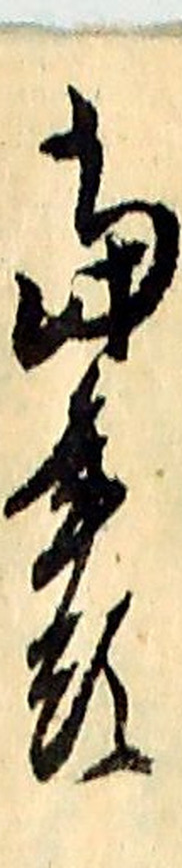当年頭
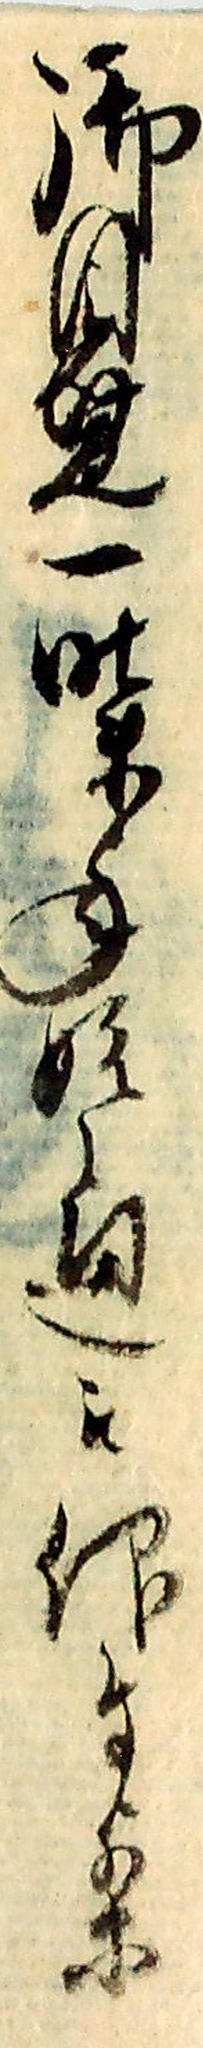御目見一昨未年始之通被仰付候条
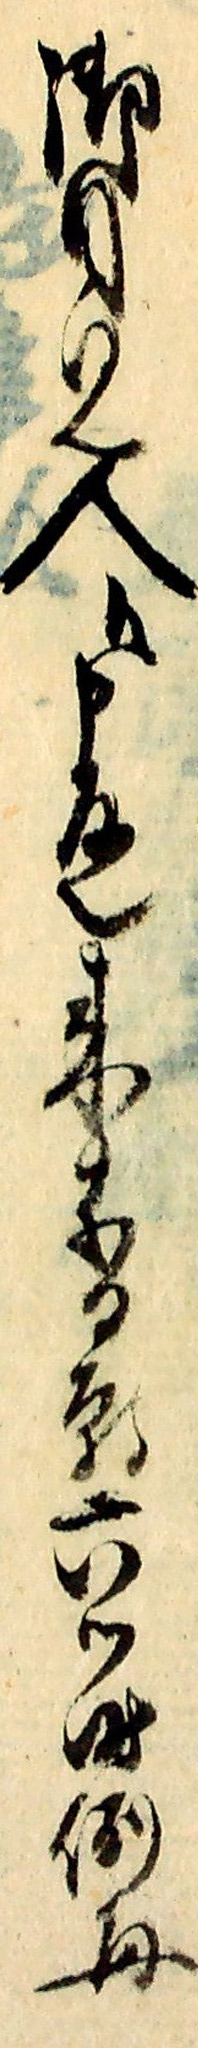御目見人え申通来十五日朝六つ時例毎
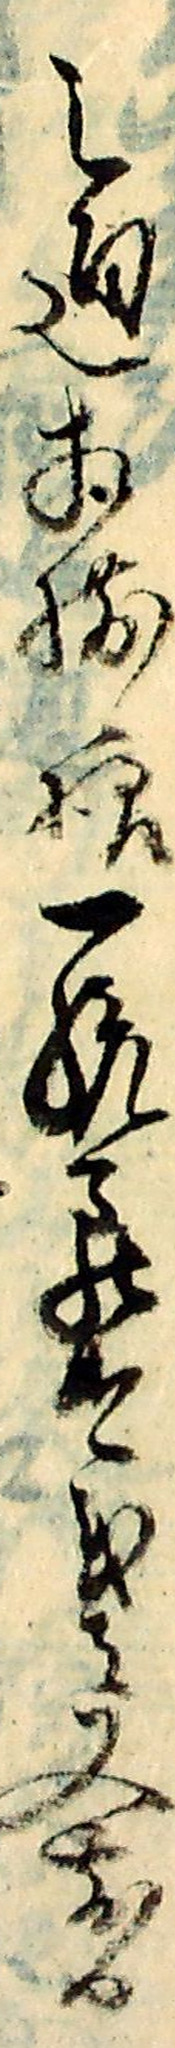之通相揃候様一統罷出候義は御入前日
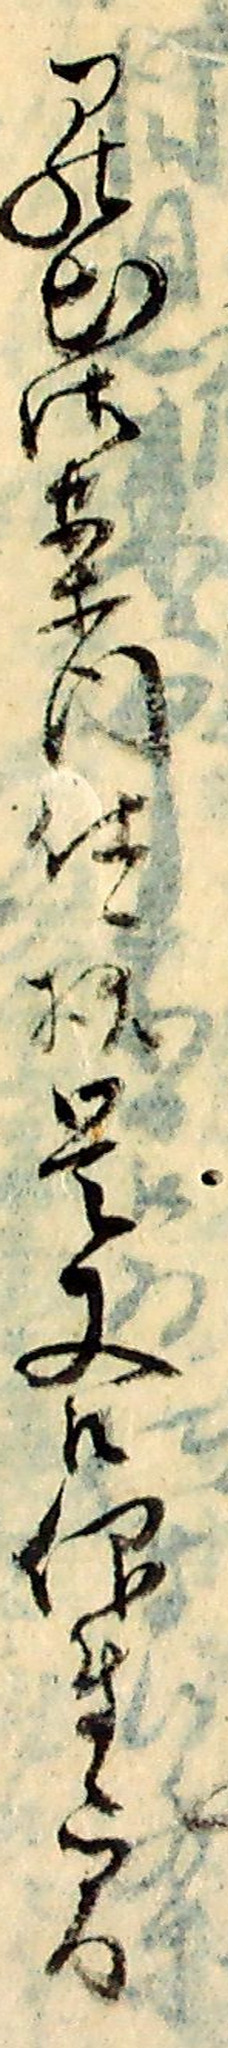罷出御案内仕候様是又被仰付候間
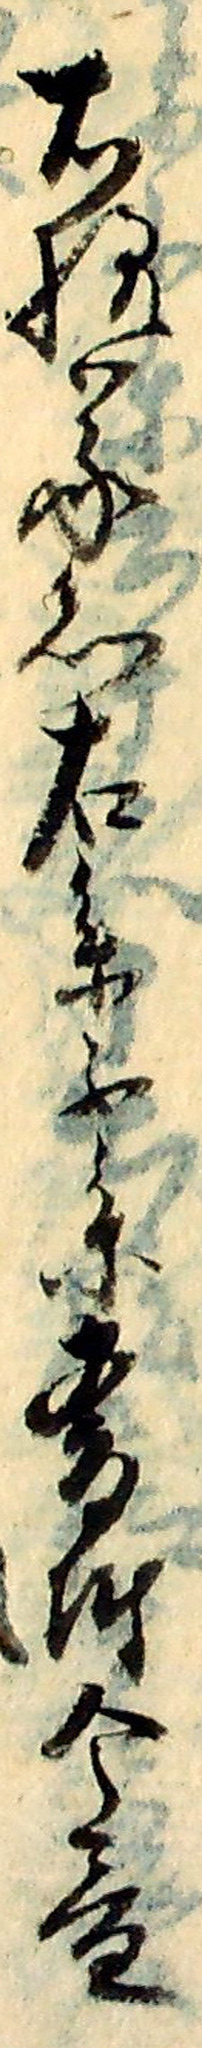右様御承知右参不参書附今昼
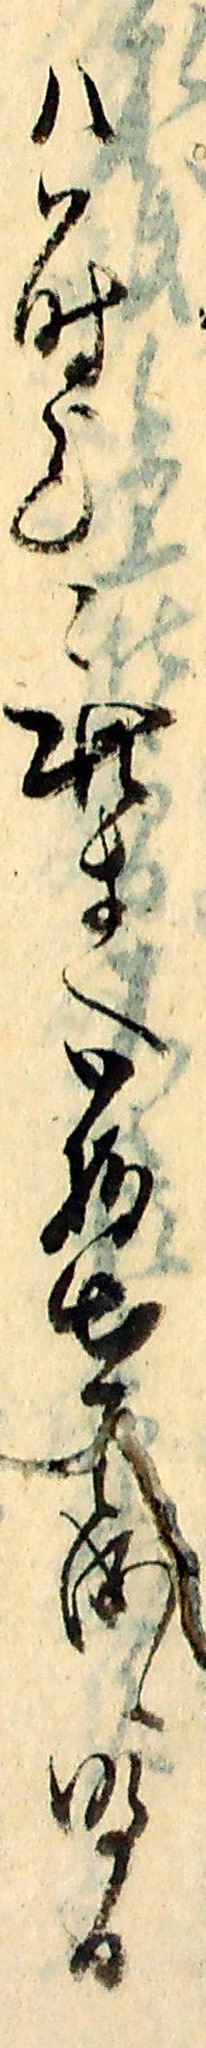八つ時迄に此方へ御指出可被成候明日
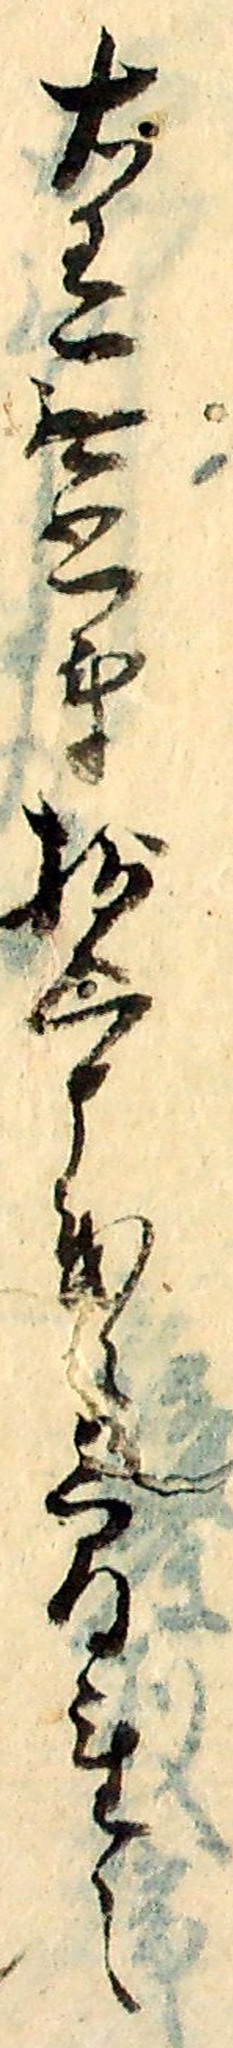右有無書付指上申義に候間重々
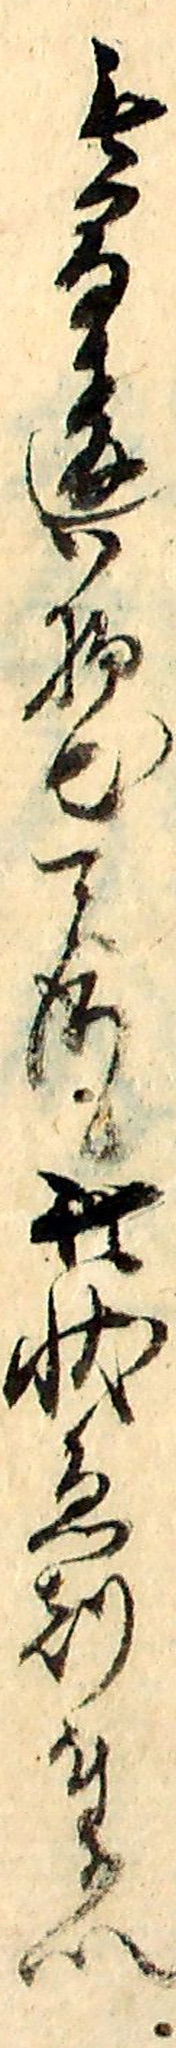無間違御指出可被成候此状急刻付を以

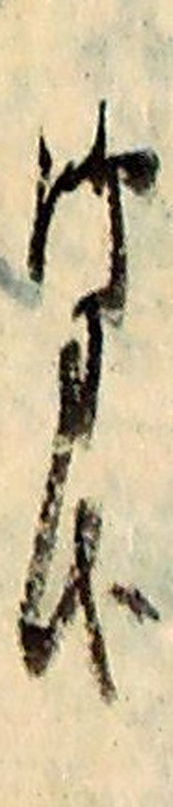御用代
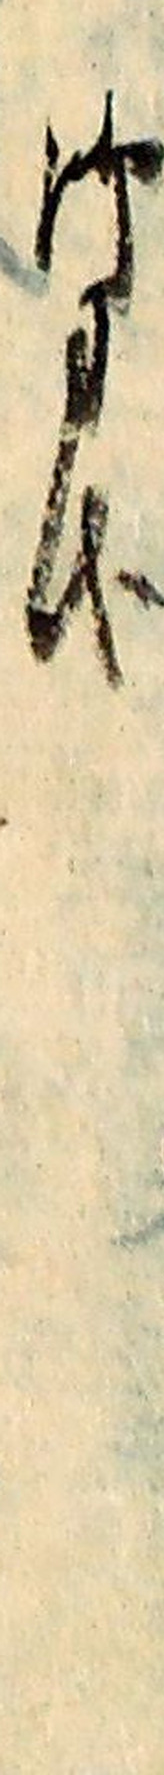御用代
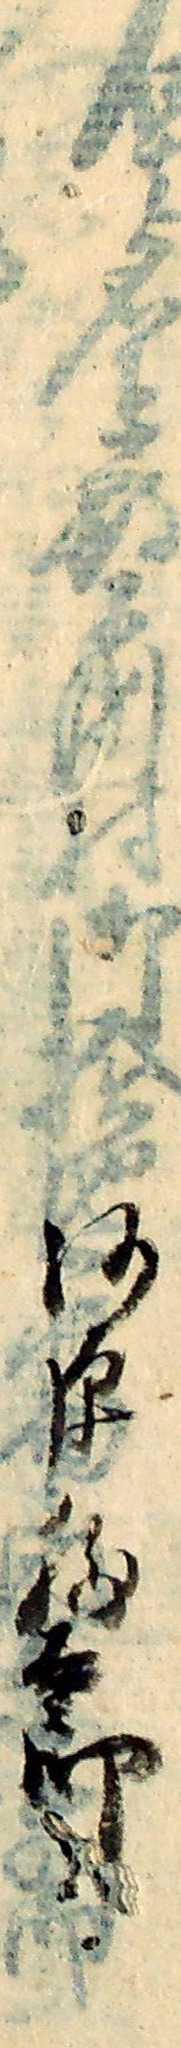河原孫太郎
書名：諸御願書控(後藤氏壱番）
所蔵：鳴門教育大学 Naruto University of Education
